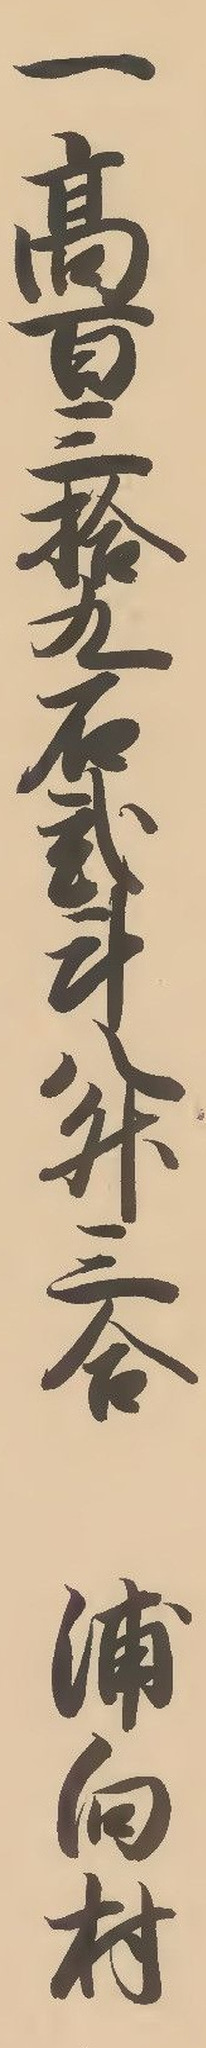一高百三拾九石弐斗八升三合浦向村
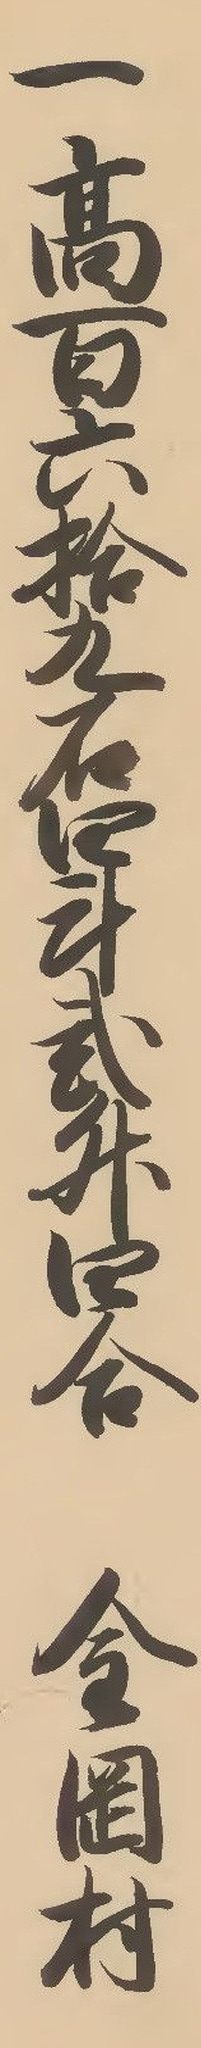一高百六拾九石四斗弐升四合金岡村
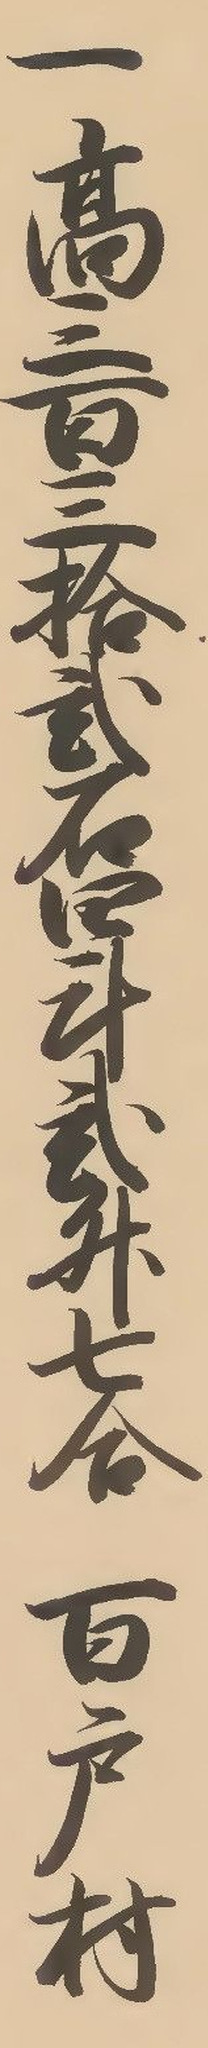一高三百三拾弐石四斗弐升七合百戸村
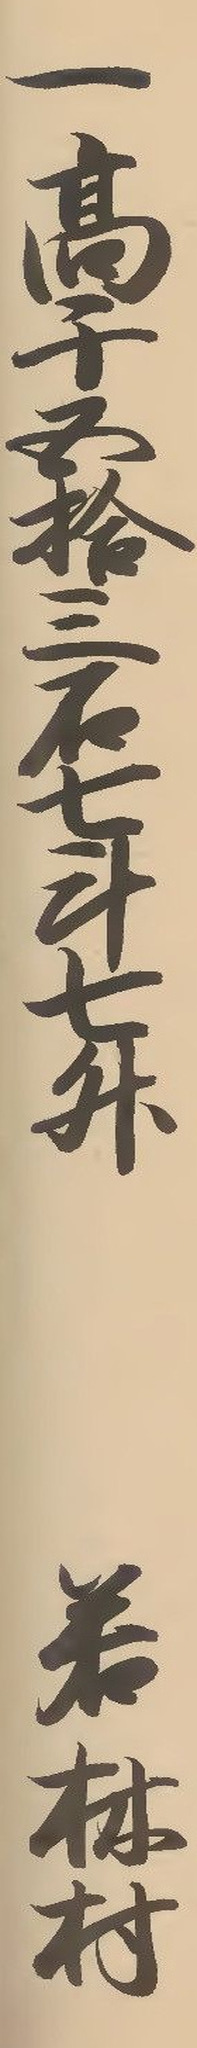一高千五拾三石七斗七升若林村
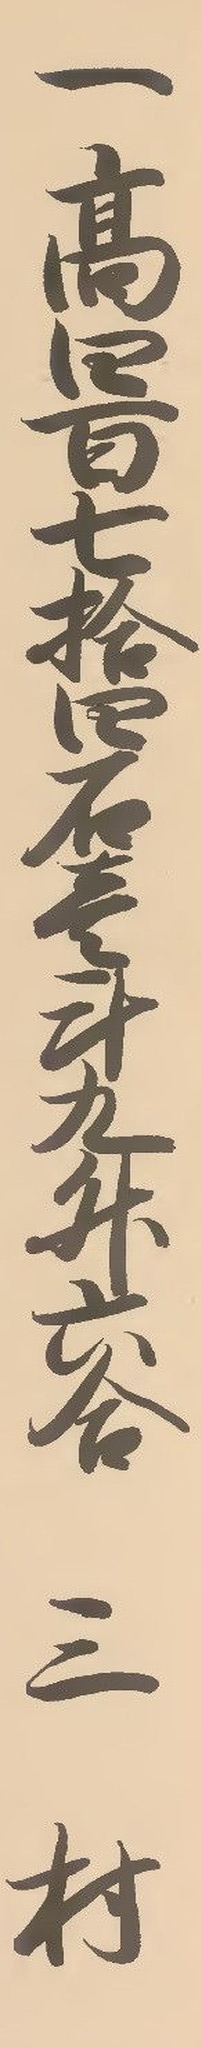一高四百七拾四石壱斗九升六合三村
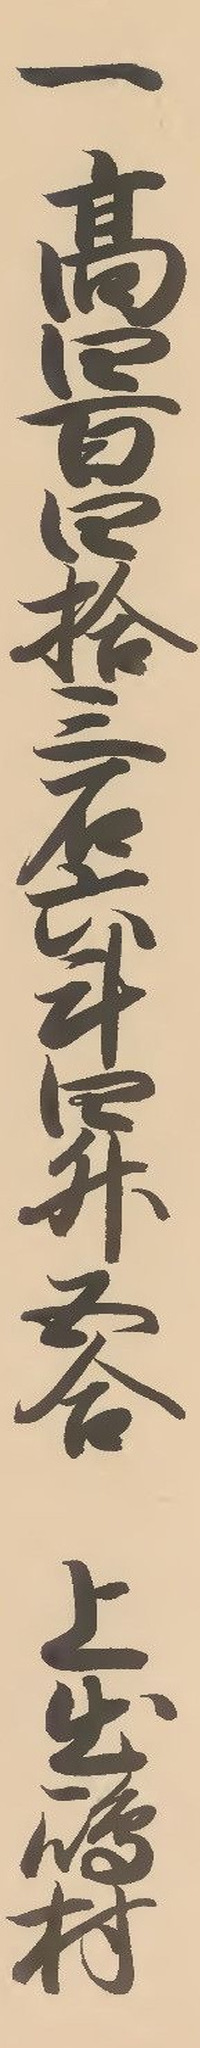一高四百四拾三石六斗四升五合上出島村
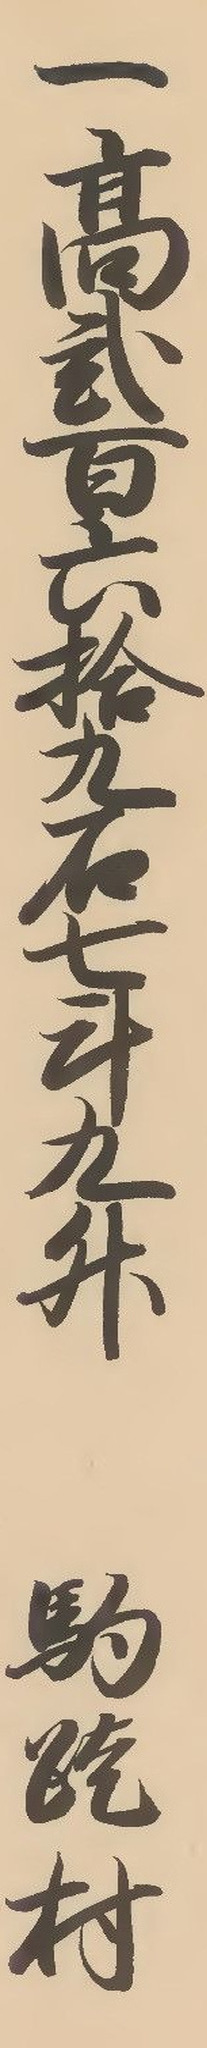一高弐百六拾九石七斗九升駒跿村
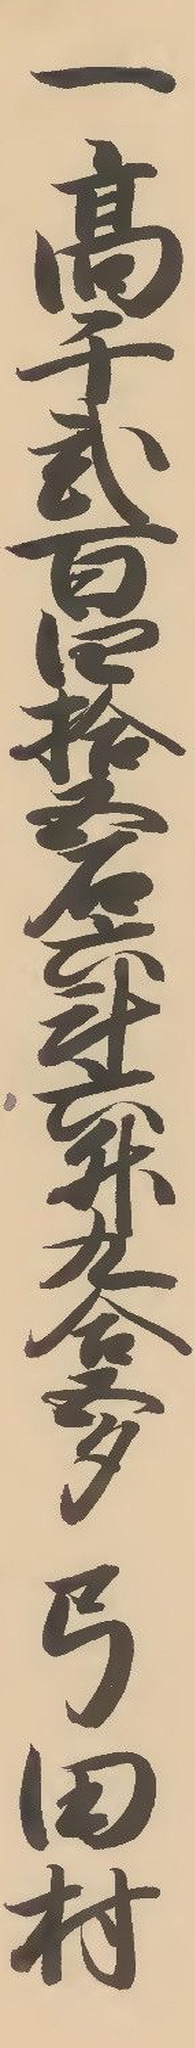一高千弐百四拾五石六斗六升九合五勺弓田村

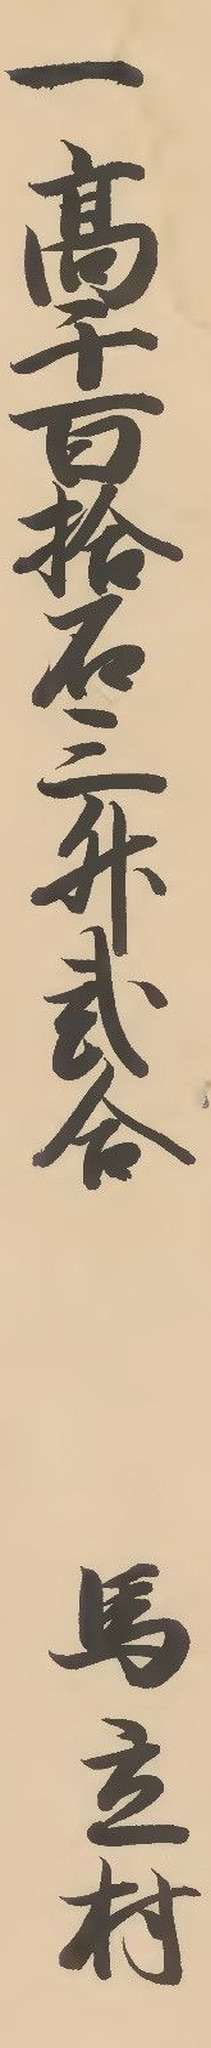一高千百拾石三升弐合馬立村
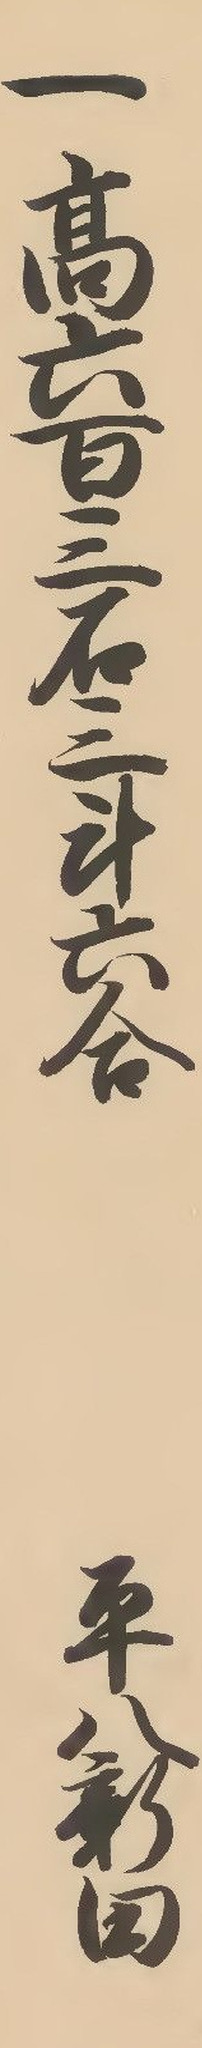一高六百三石三斗六合平八新田
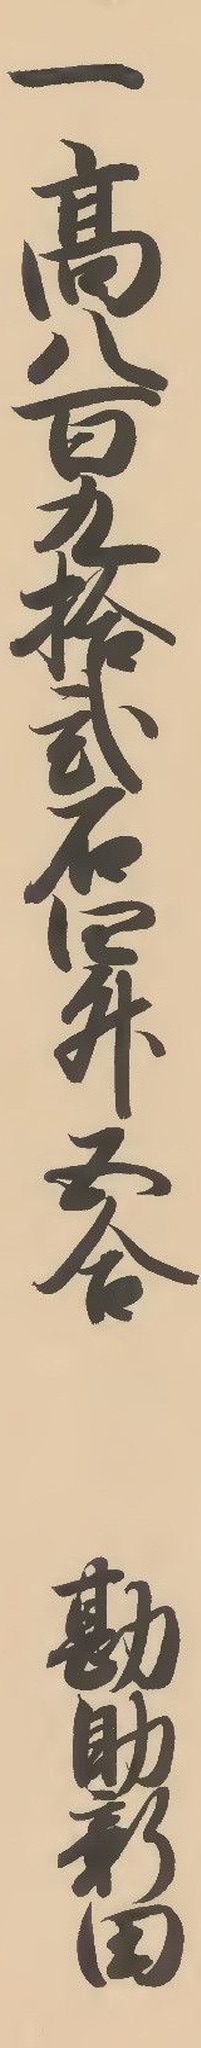一高八百九拾弐石四升五合勘助新田
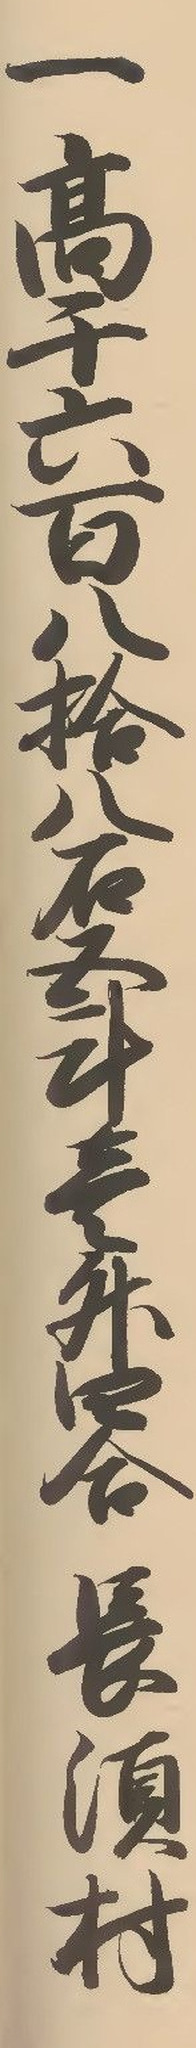一高千六百八拾八石五斗壱升四合長須村
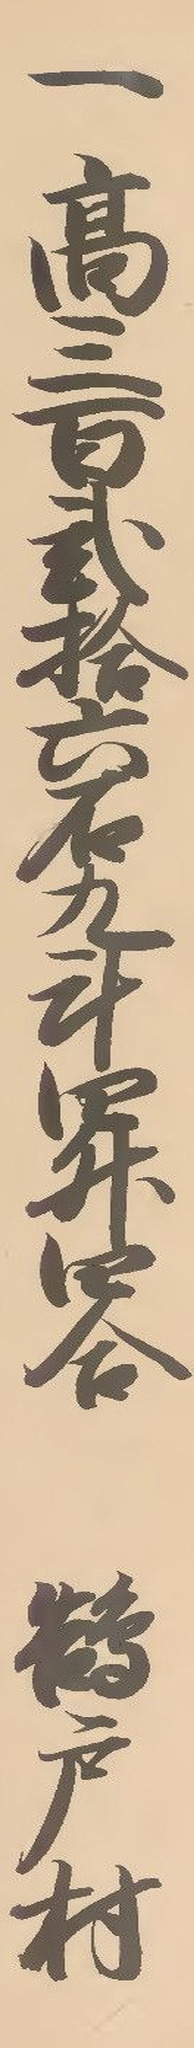一高三百弐拾六石九斗四升四合鵠戸村
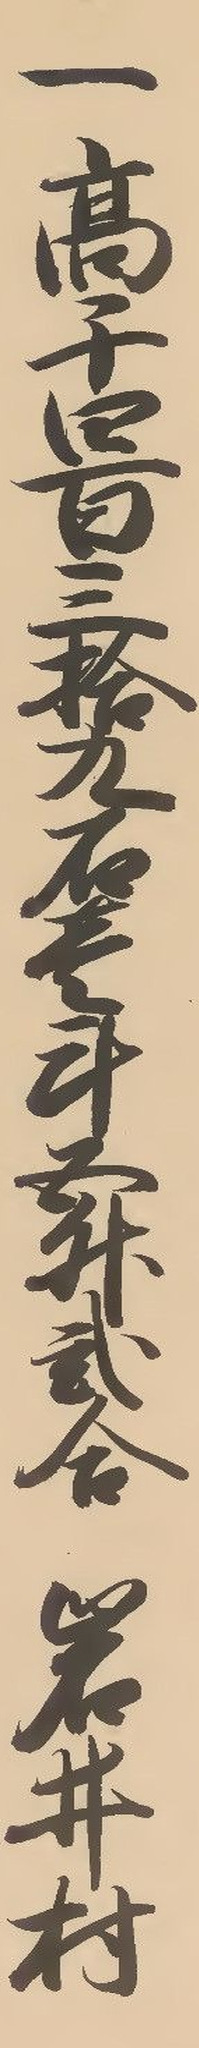一高千四百三拾九石壱斗五升弐合岩井村
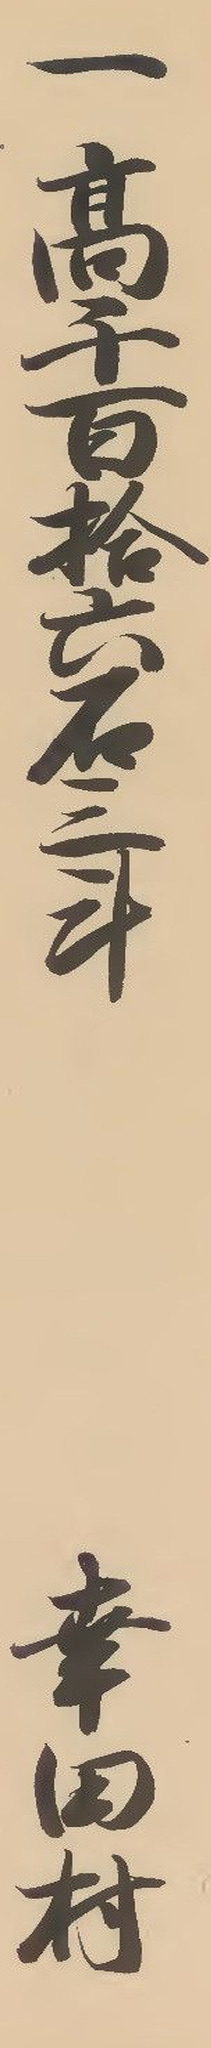一高千百拾六石三斗幸田村
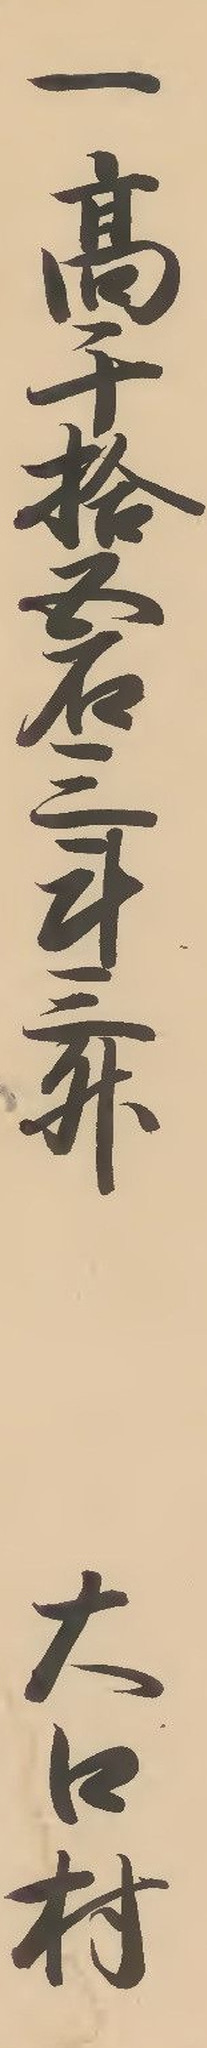一高千拾五石三斗三升大口村
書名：下総国郷帳
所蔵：国立公文書館 National Archives of Japan
